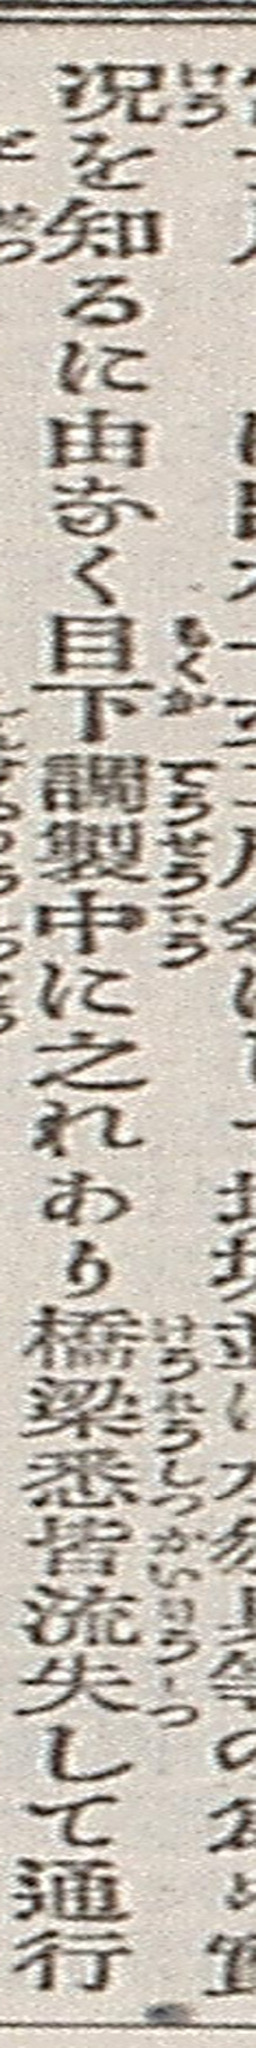況を知るに由なく目下調整中に之れあり橋梁悉皆流失して通行
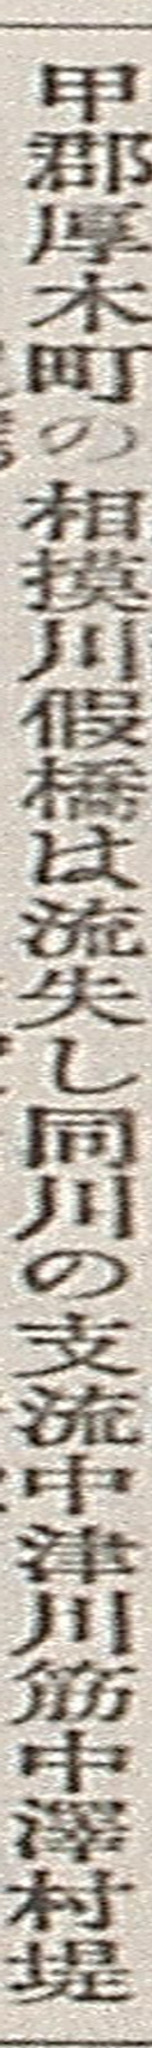甲郡厚木町の相模川假橋は流失し同川の支流中津川筋中澤村堤
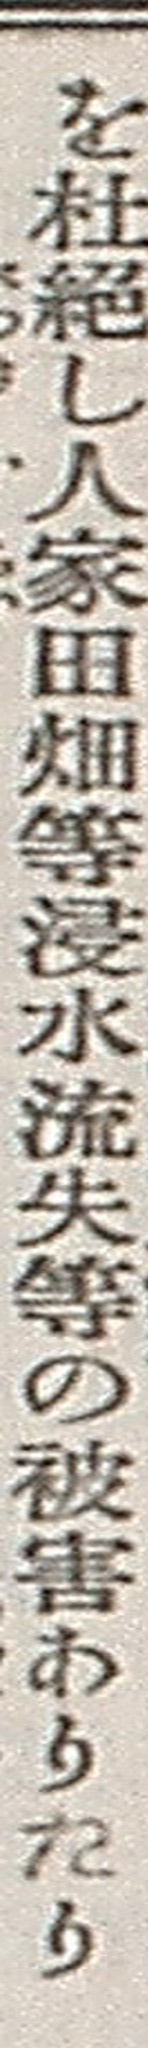を杜絶し人家田畑等浸水流失等の被害ありたり
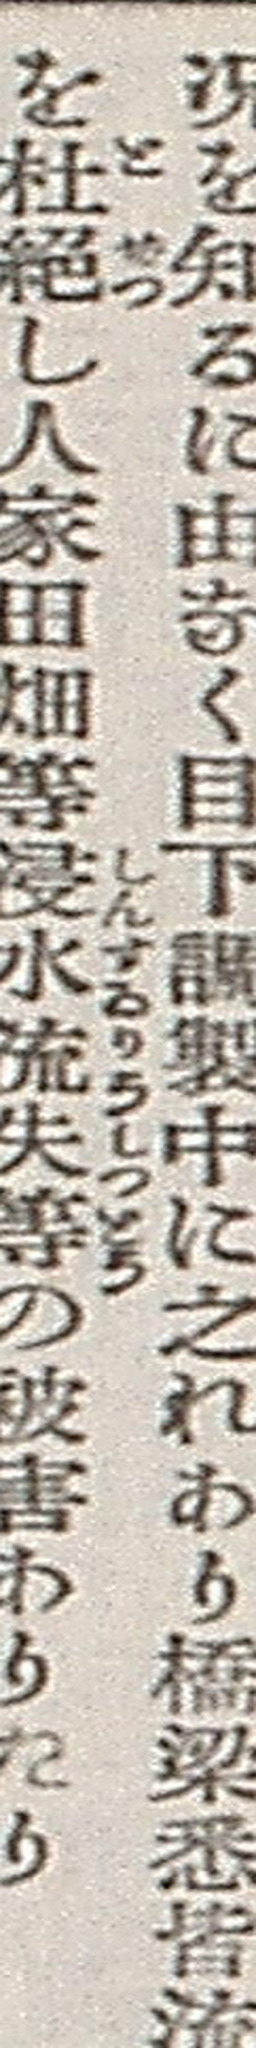を杜絶し人家田畑等浸水流失等の被害ありたり
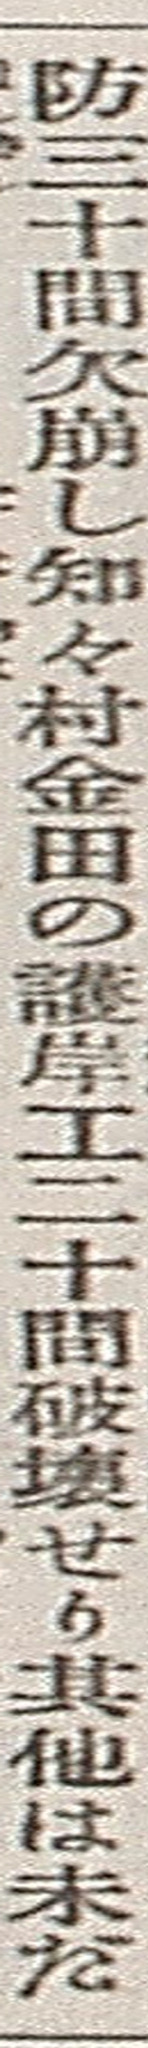防三十間欠崩し知々村金田の護岸工二十間破壊せり其他は未だ
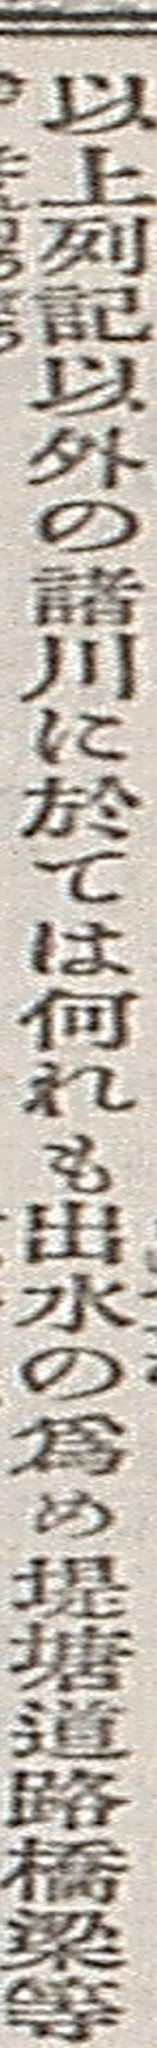以上列記以外の諸川に於ては何れも出水の為め堤塘道路橋梁等
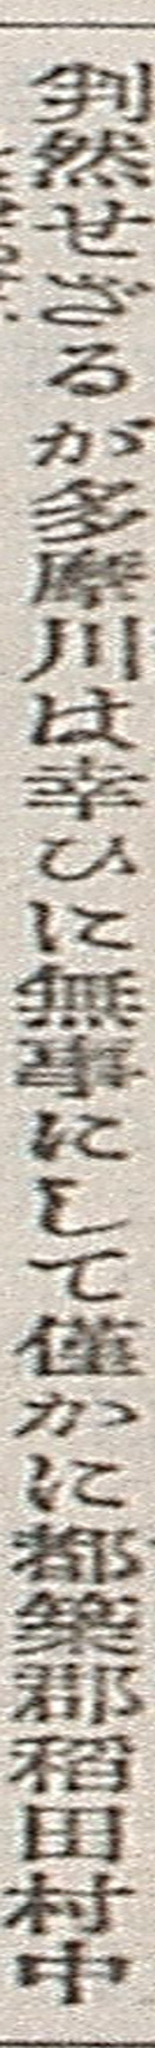判然せざるが多摩川は幸ひに無事にして僅かに都築郡稲田村中
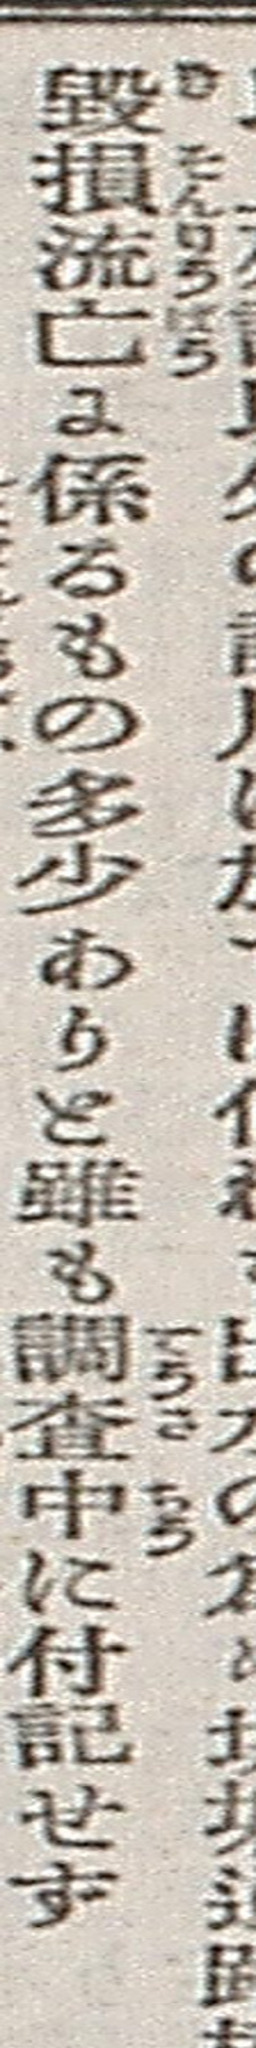毀損流亡に係るもの多少ありと雖も調査中に付記せず
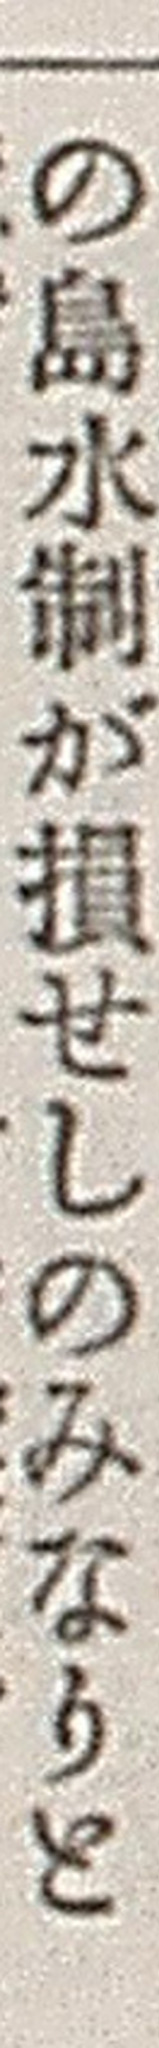の島水制が損せしのみなりと
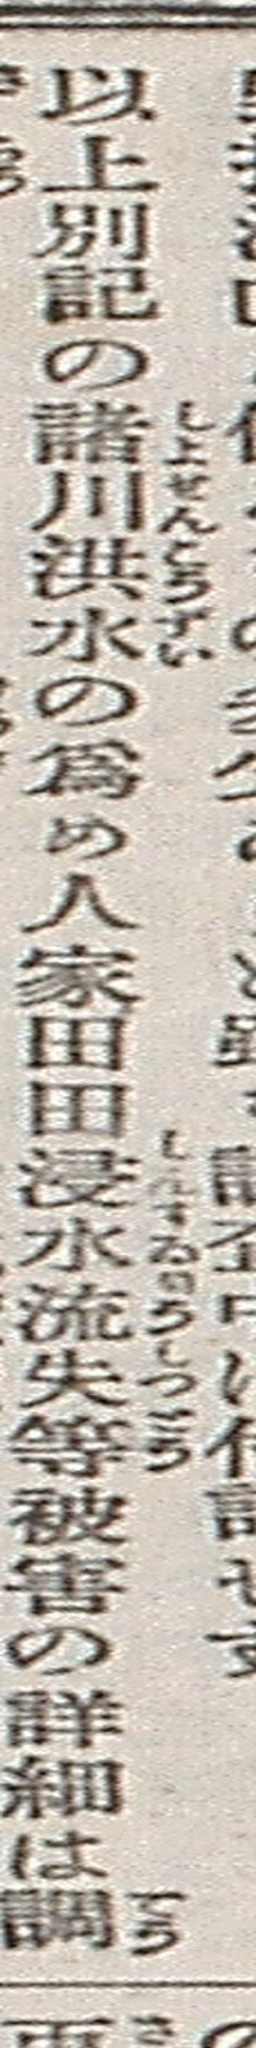以上別記の諸川洪水の為め人家田田浸水流失等被害の詳細は調
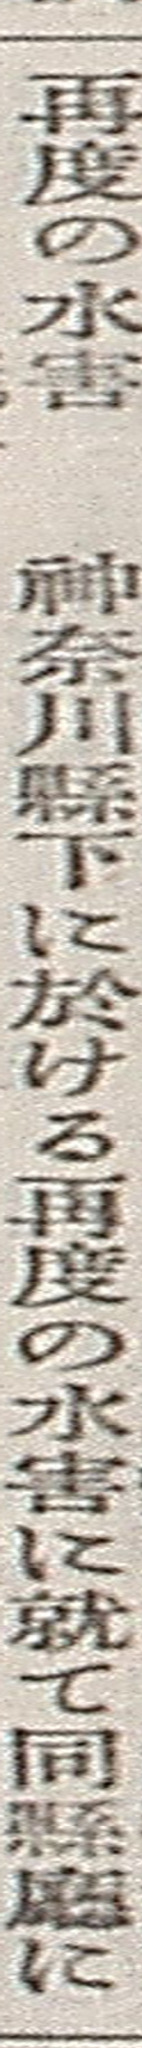再度の水害神奈川県下に於ける再度の水害に就て同県庁に
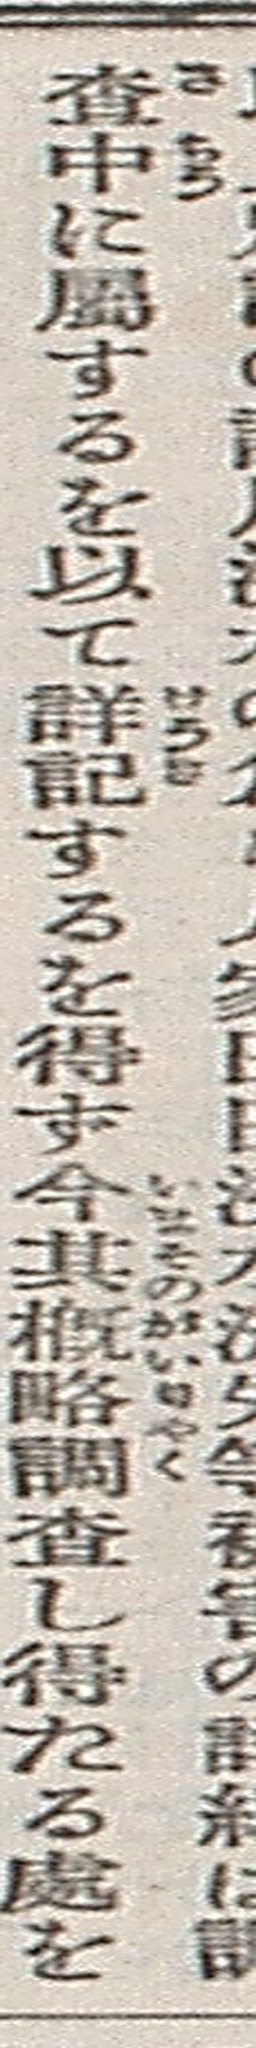査中に属するを以て詳記するを得ず今其概略調査し得たる処を
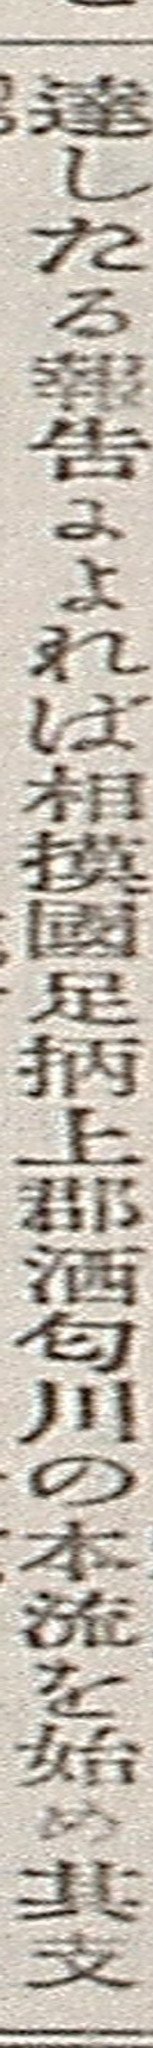達したる報告によれば相模国足柄上郡酒匂川の本流を始め其支
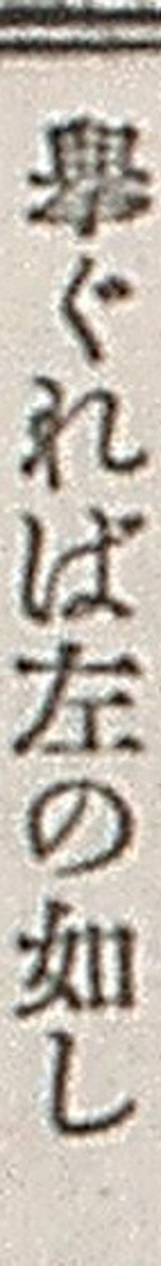挙ぐれば左の如し
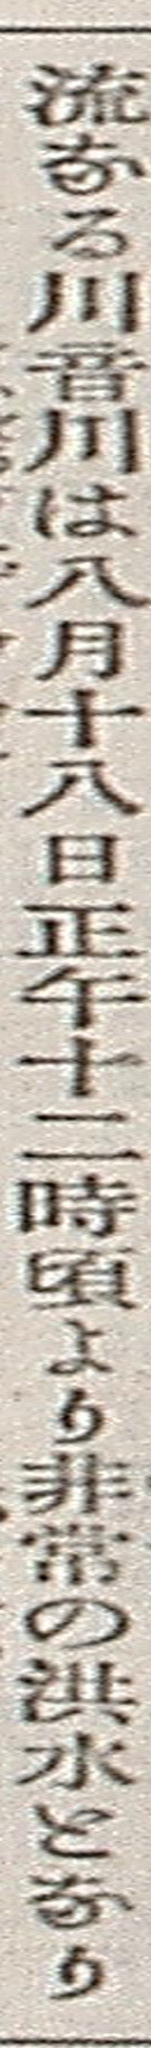流なる川音川は八月十八日正午十二時頃より非常の洪水となり
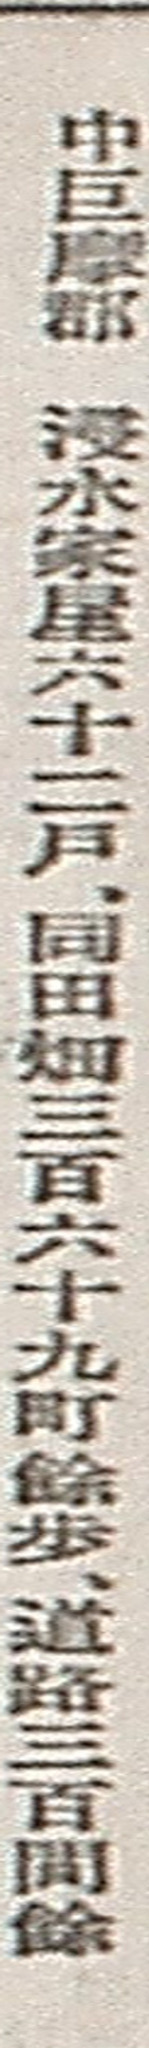中巨摩郡浸水家屋六十二戸、同田畑三百六十九町餘歩、道路三百間餘
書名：風俗畫報臨時増刊第百二十八號　洪水被害録（下）
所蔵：東京大学地震研究所図書室 Earthquake Research Institute Library, The University of Tokyo, JAPAN
